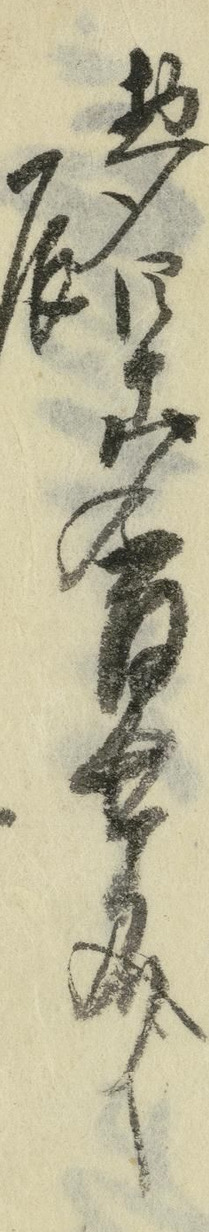惣〆四十八貫百七文
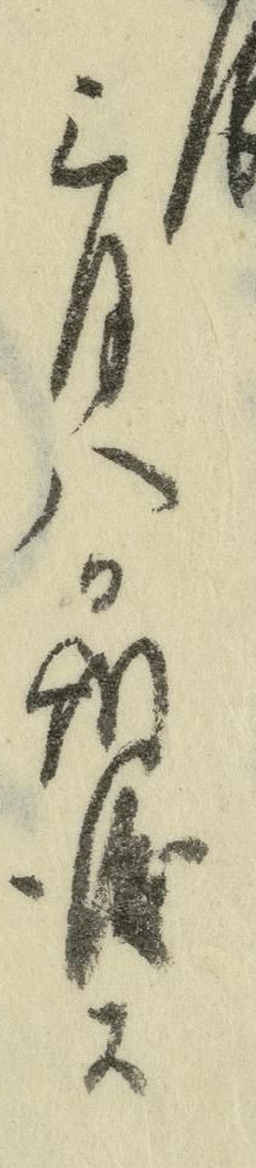辰三月八日相渡ス

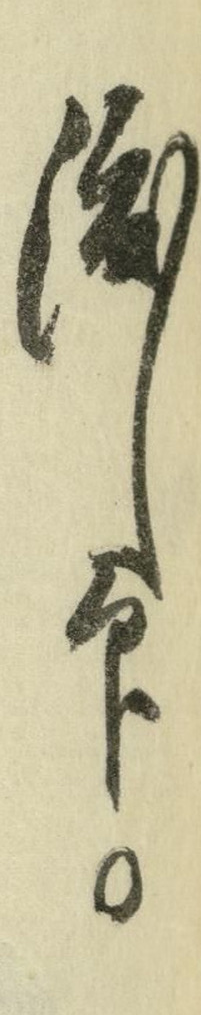渡し印
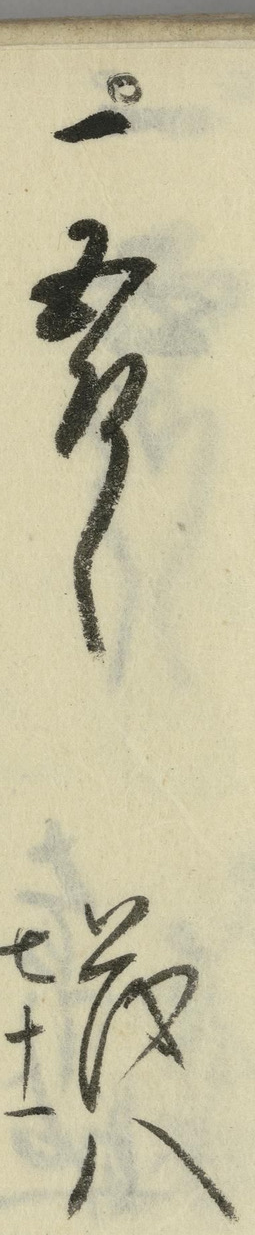一五百文茂八
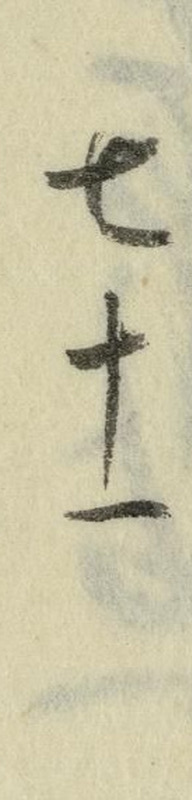七十一
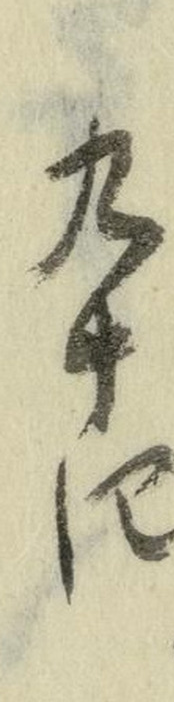九十四
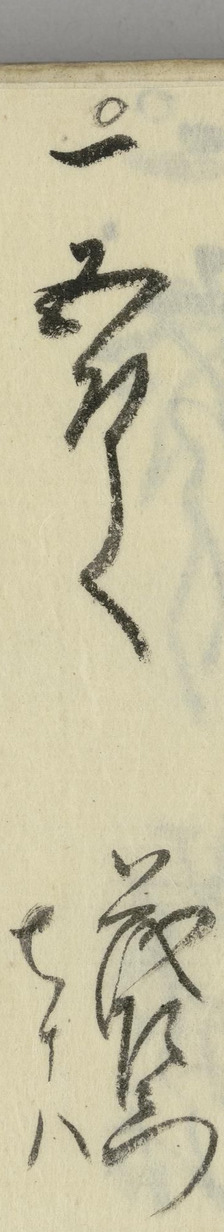一五百文茂左衛門
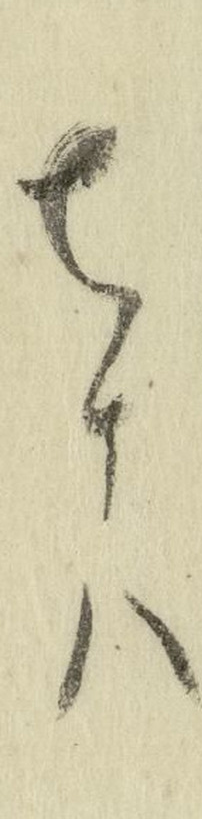七十八
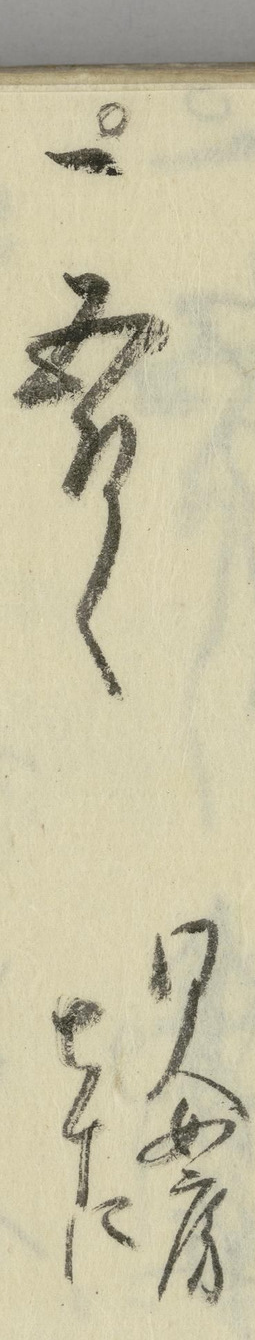一五百文同人女房
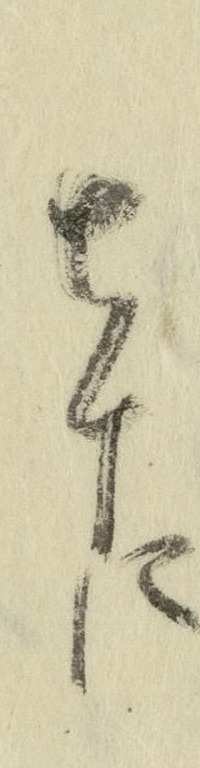七十四
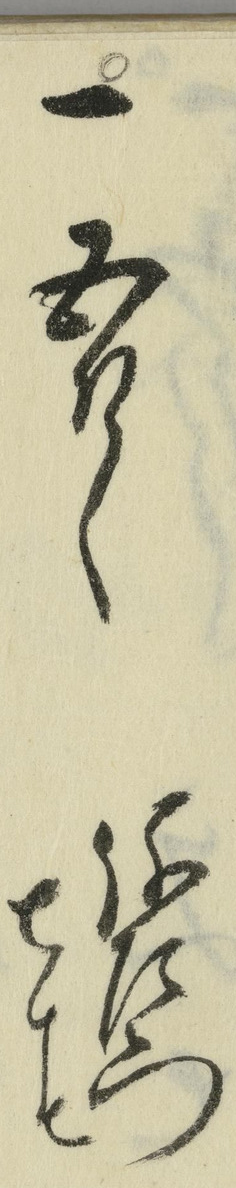一五百文弥左衛門
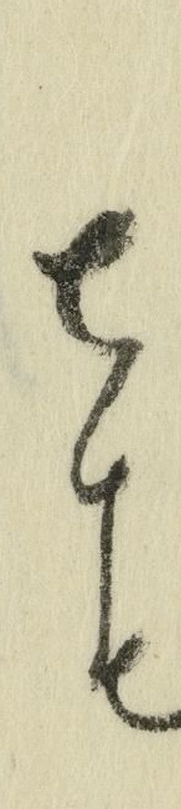七十七
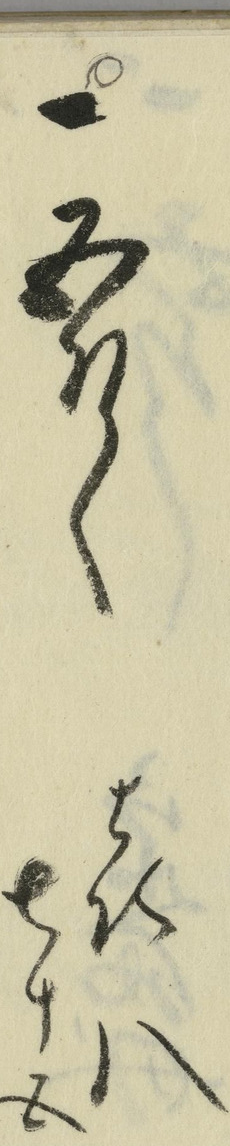一五百文茂八
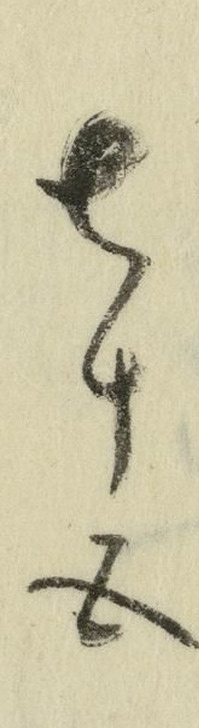七十五
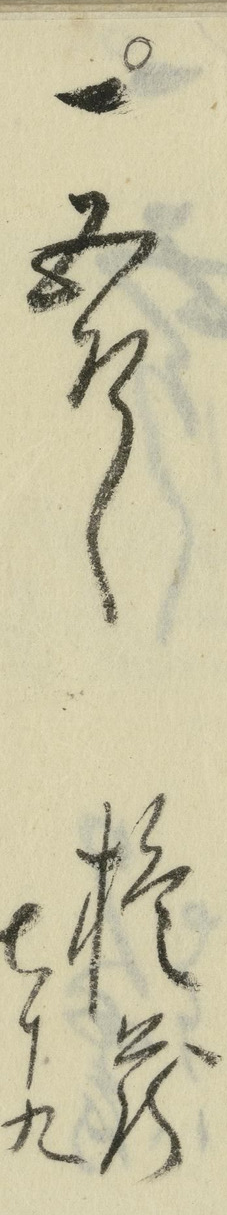一五百文権蔵
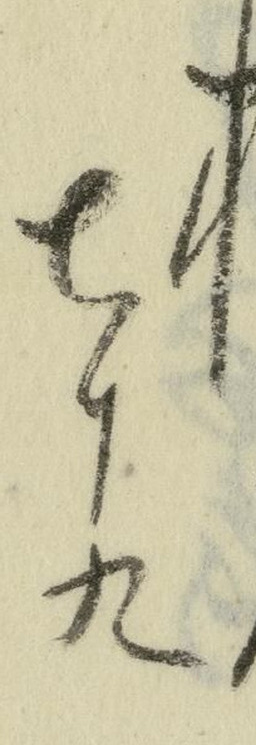七十九
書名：天明淺間噴火ニ関スル書類
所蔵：東京大学地震研究所図書室 Earthquake Research Institute Library, The University of Tokyo, JAPAN
